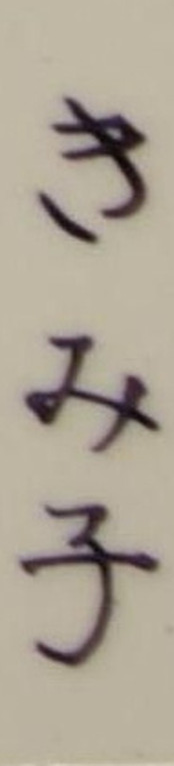きみ子
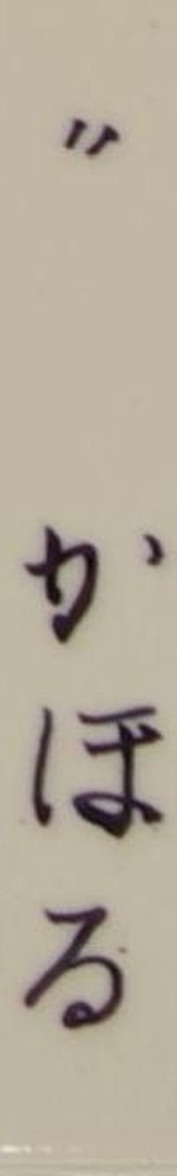かほる
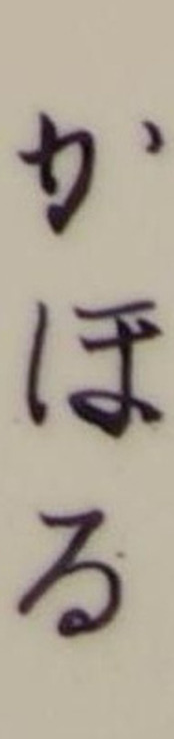かほる
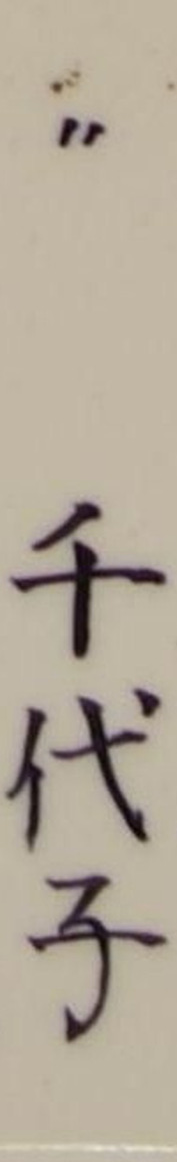千代子
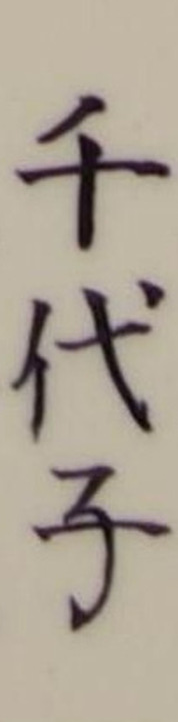千代子
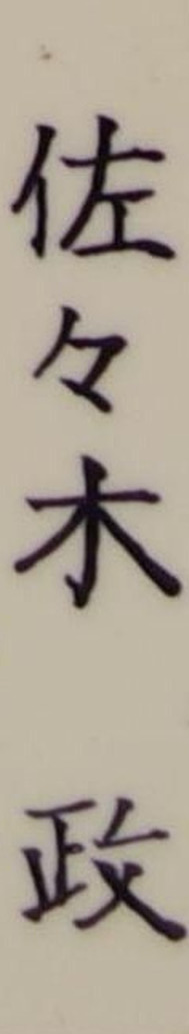佐々木政
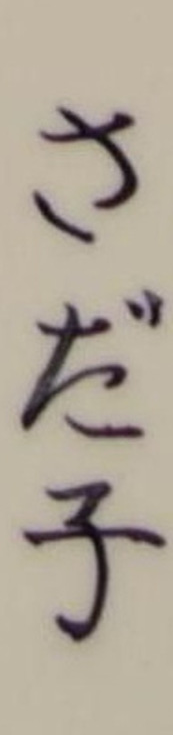さだ子
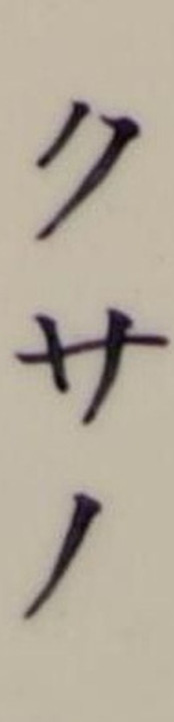クサノ
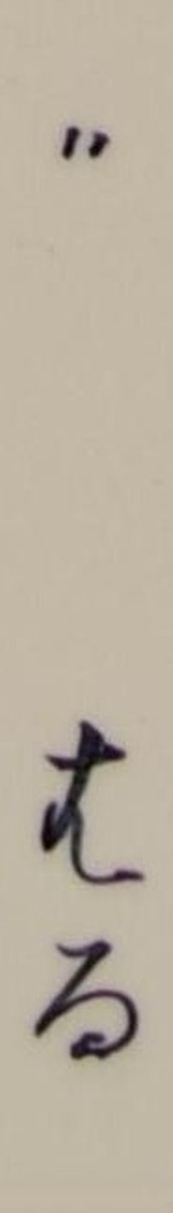かほる
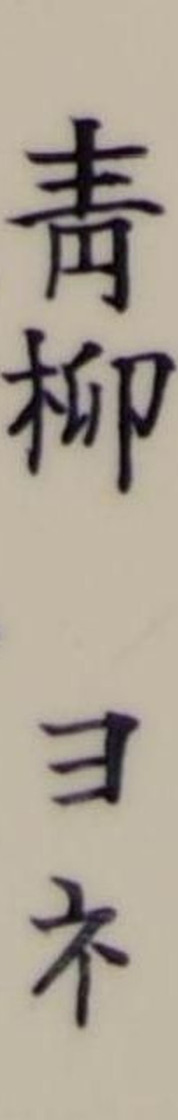青柳ヨネ
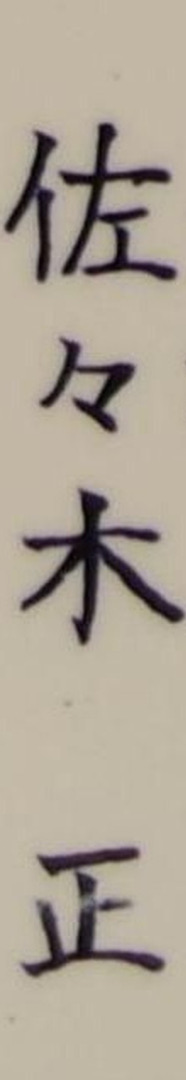佐々木正

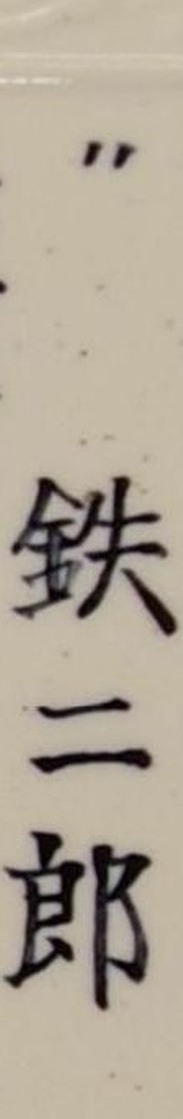鉄二郎
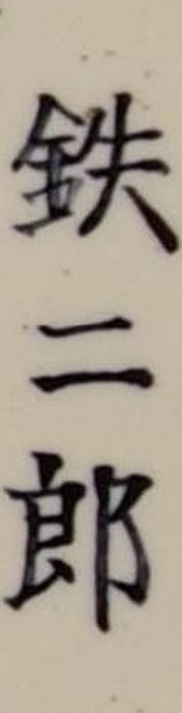鉄二郎
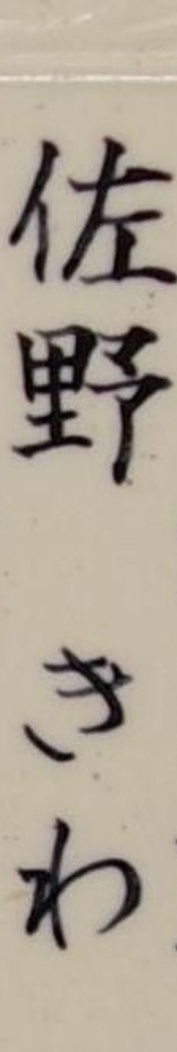佐野きわ
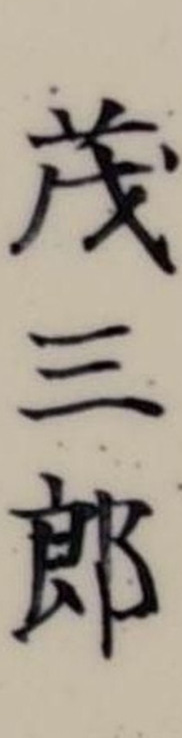茂三郎
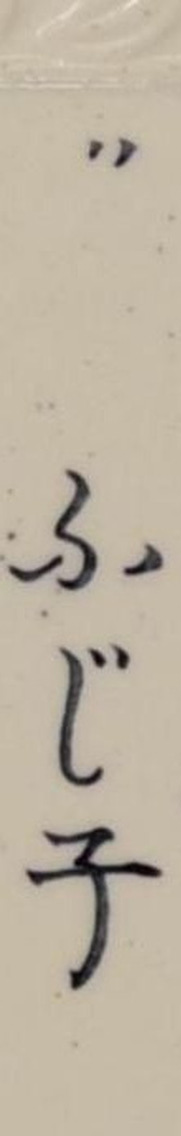ふじ子
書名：E~L
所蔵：高野山金剛峯寺
